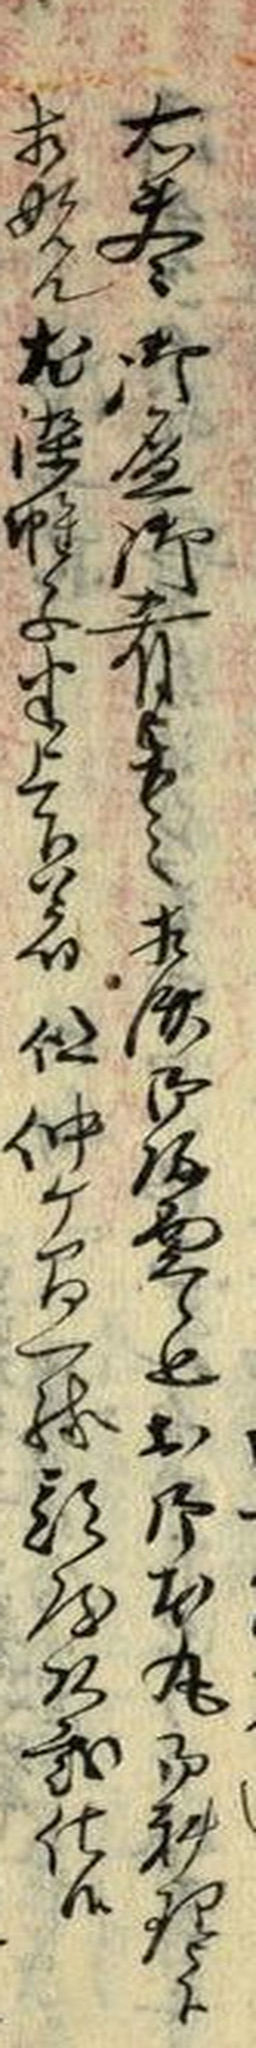相始ㇽ尤染帷子半上下着但仲ケ間一統部屋頂戴仕候
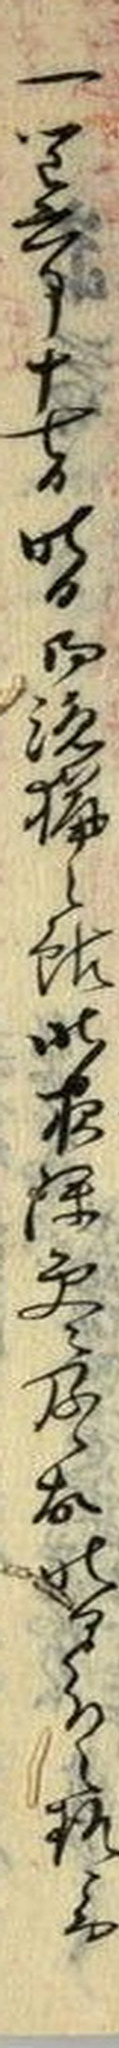一閏六月十七日昨日御漁獲の鮎昨夜深更ニ及候故昨日被下候趣ニ而
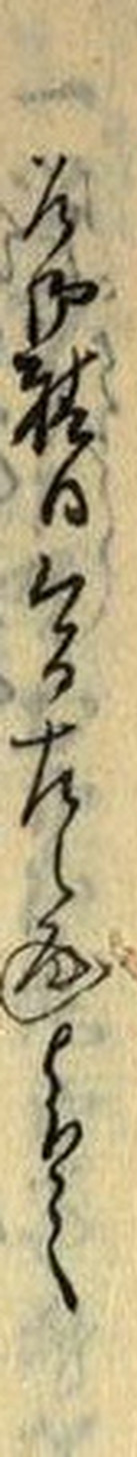為御精日今日左之通被下之
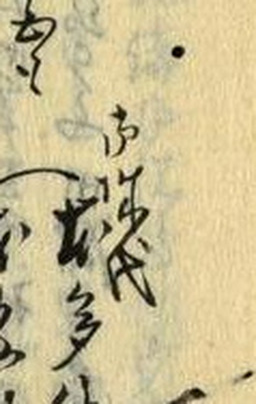御城代
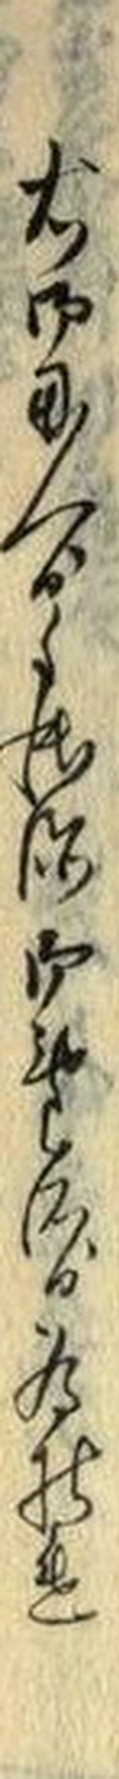右御用人ゟ手紙添御台所ゟ為持遣
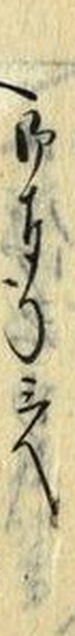御奉行三人
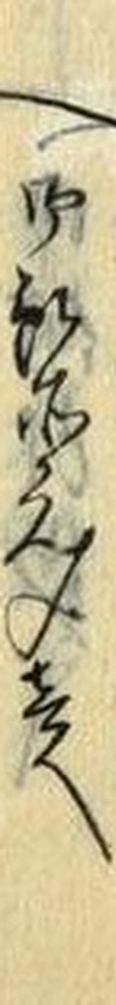御預所元〆壱人
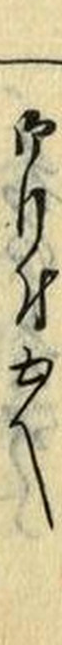御目付五人
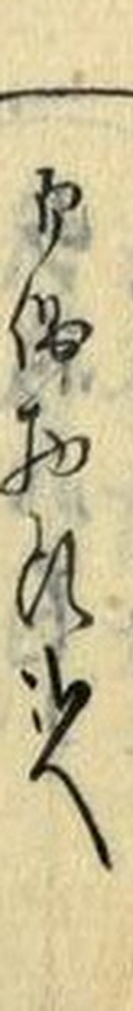御側物頭弐人
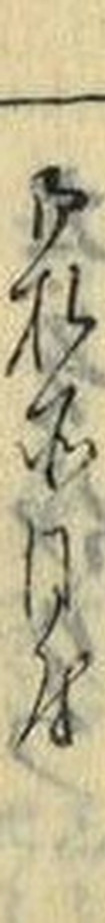御札所目付

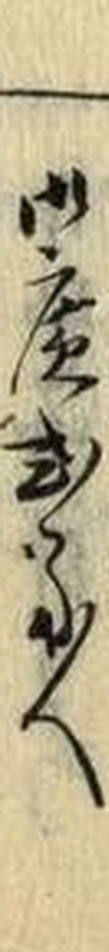御広式御用人
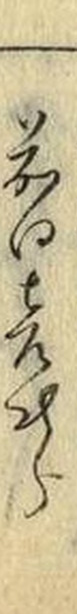同前田彦次郎
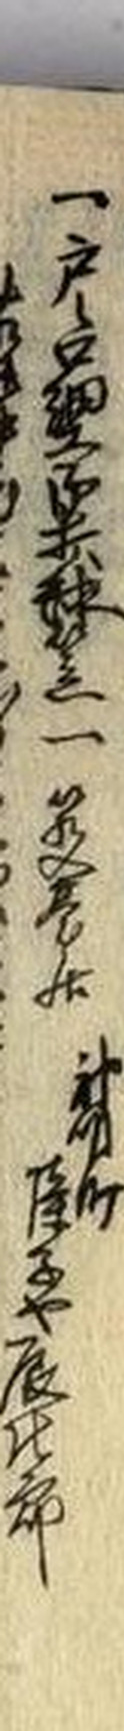一戸之口細工御打毬笠一箱入台居障子や辰次郎
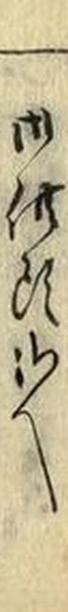御供頭弐人
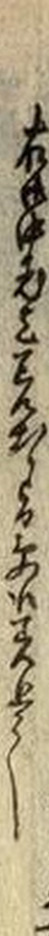右御中老迄差出候ニ付受取差上之
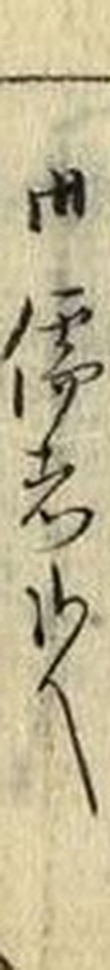御儒者弐人
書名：少傅日録抄（斉承付側向頭取日記、在国）
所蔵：福井県文書館 Fukui Prefectural Archives
